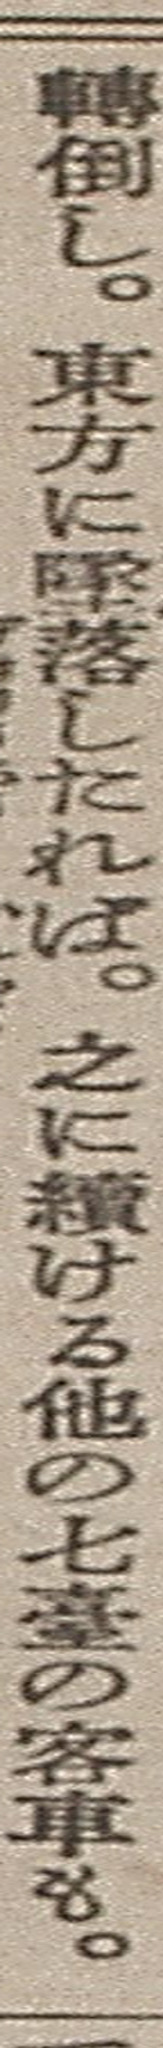転倒し。東方に墜落したれば。之に続ける他の七台の客車も。
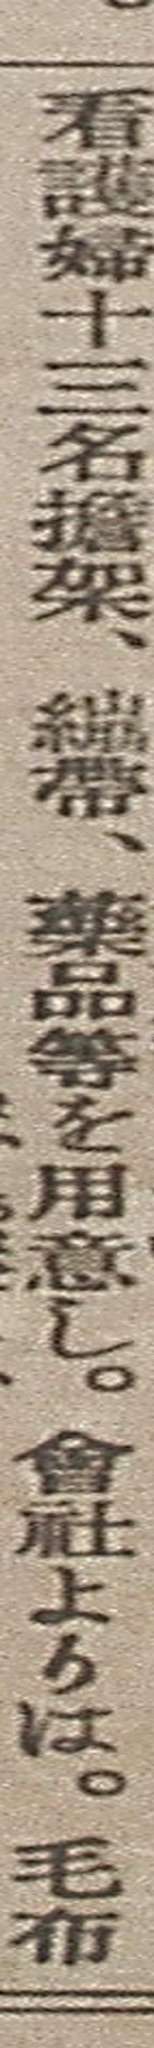看護婦十三名担架、繃帯、薬品等を用意し。会社よりは。毛布
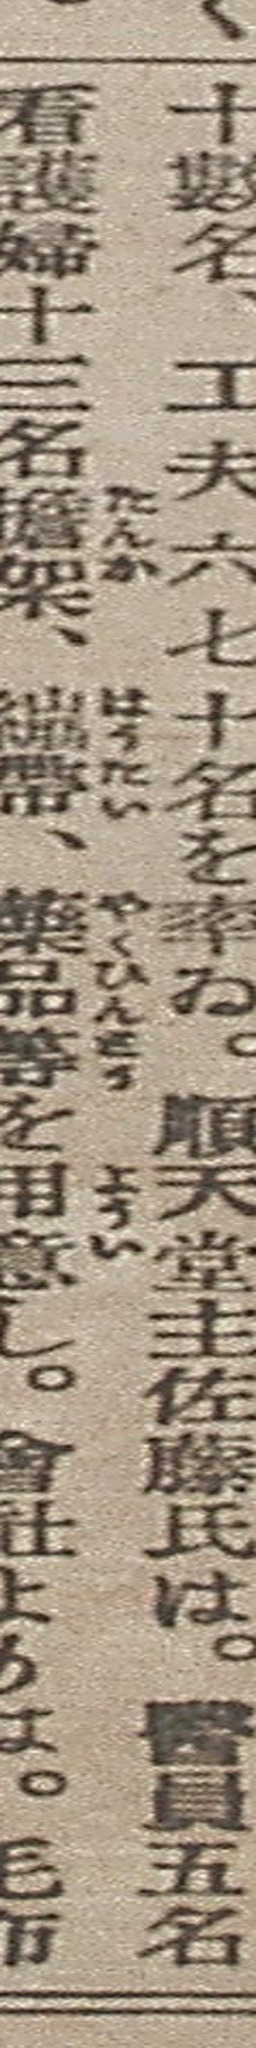看護婦十三名担架、繃帯、薬品等を用意し。会社よりは。毛布
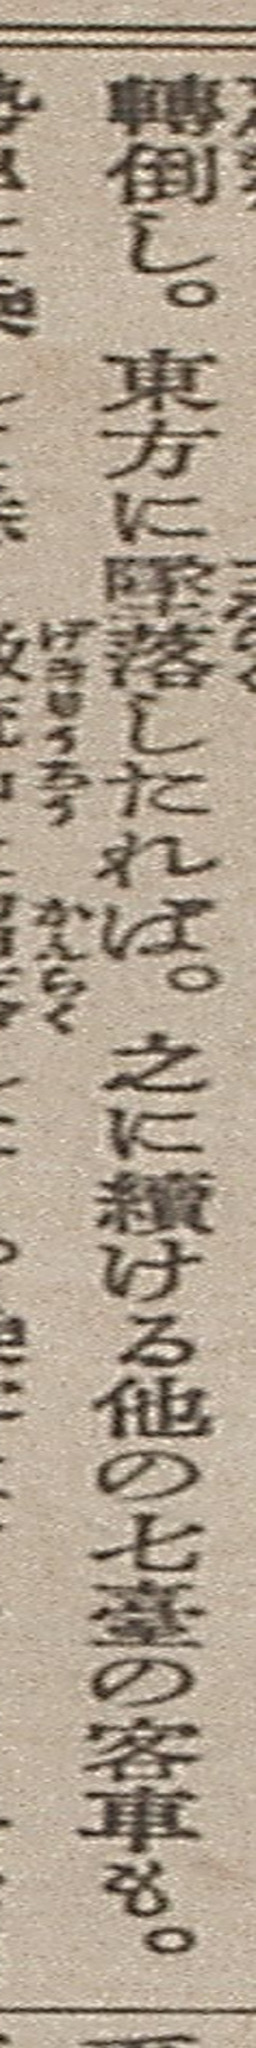転倒し。東方に墜落したれば。之に続ける他の七台の客車も。
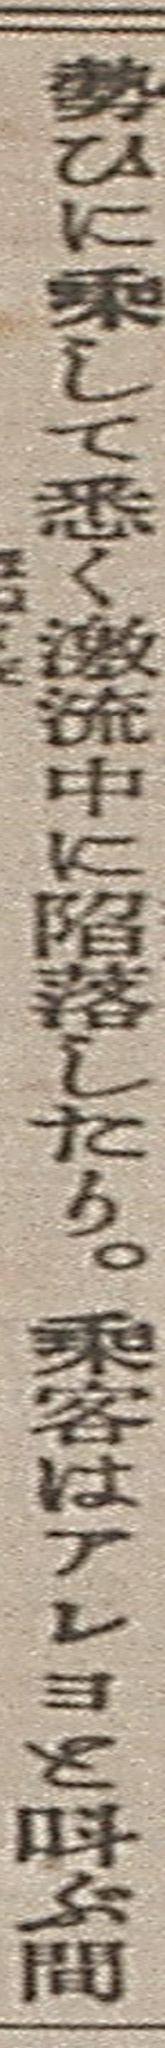勢ひに乗して悉く激流中に陥落したり。乗客はアレヨと叫ぶ間
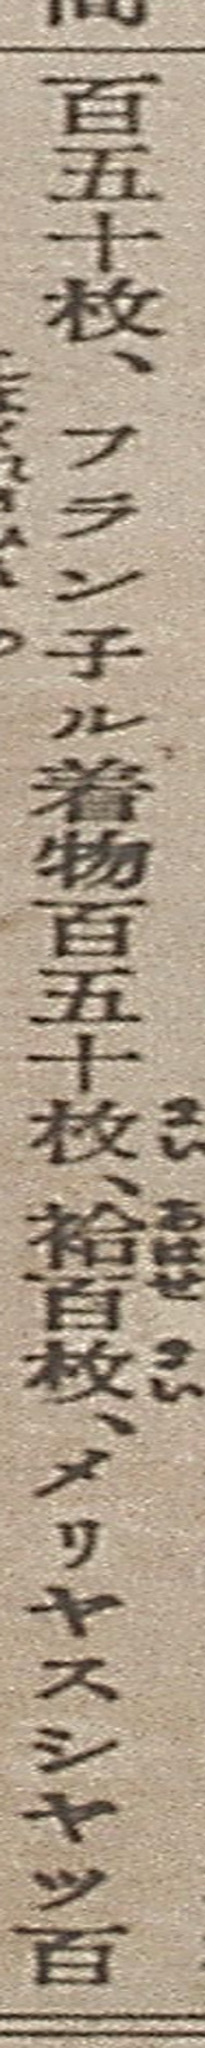百五十枚、フランネル着物百五十枚、袷百枚、メリヤスシヤツ百
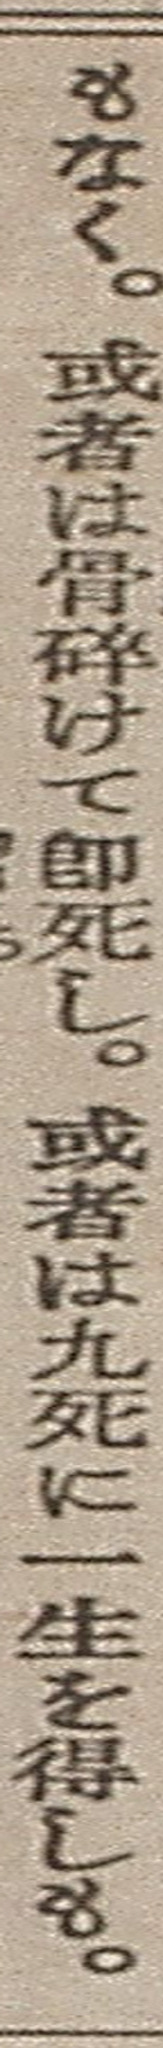もなく。或者は骨砕けて即死し。或者は九死に一生を得しも。
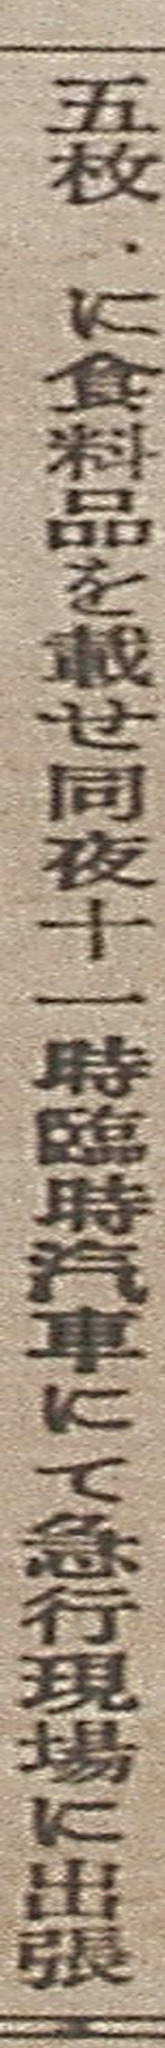五枚に食料品を載せ同夜十一時臨時汽車にて急行現場に出張
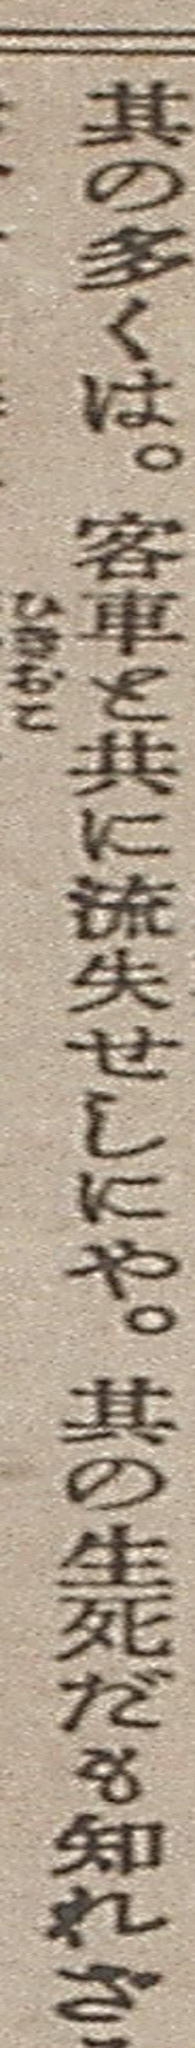其の多くは。客車と共に流失せしにや。其の生死だも知れざる
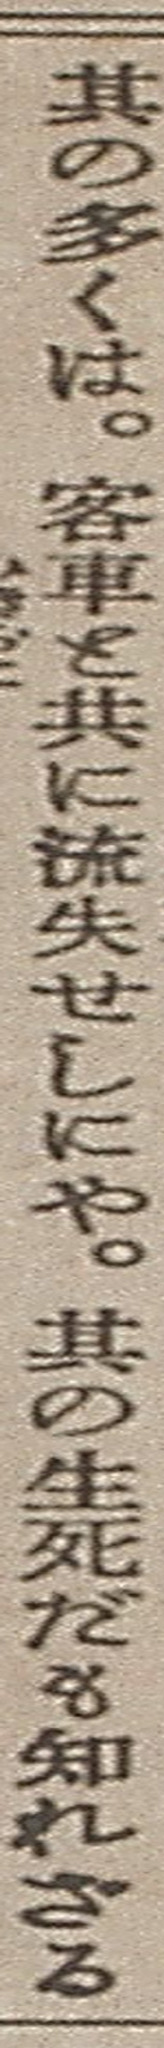其の多くは。客車と共に流失せしにや。其の生死だも知れざる
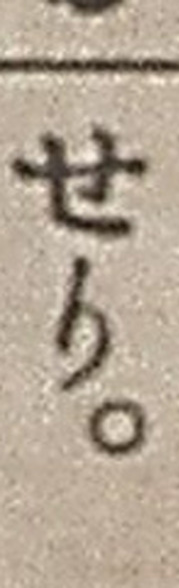せり。
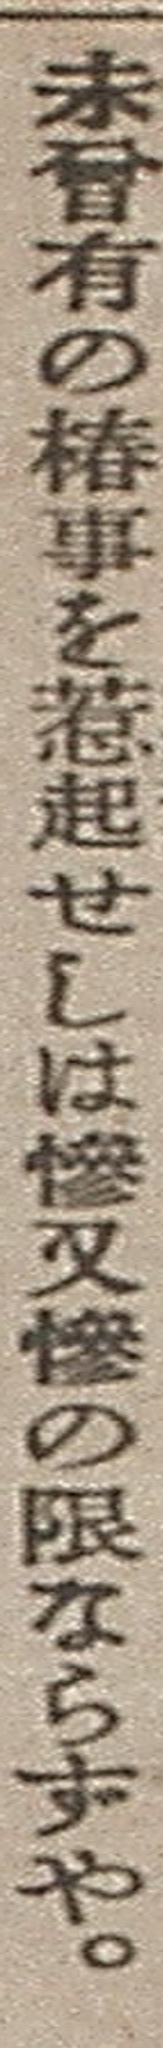未曽有の椿事を惹起せしは惨状又惨の限ならずや
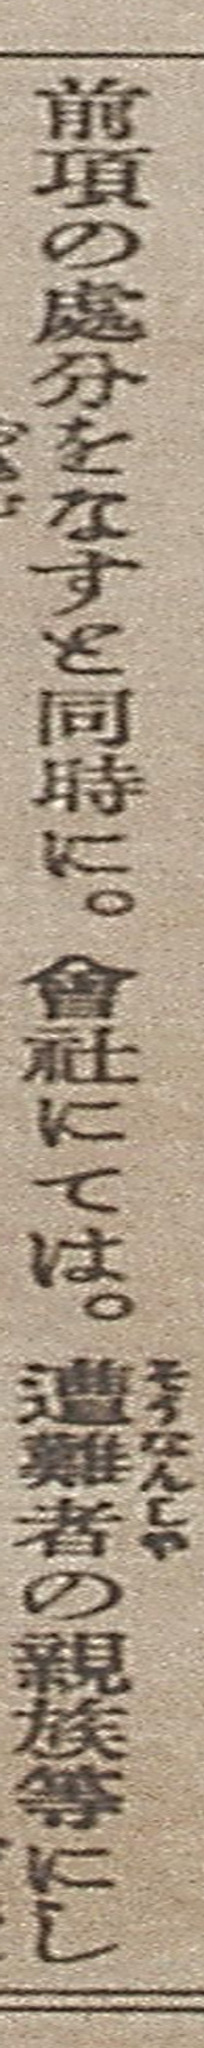前項の処分をなすと同時に。会社にては。遭難者の親族等にし
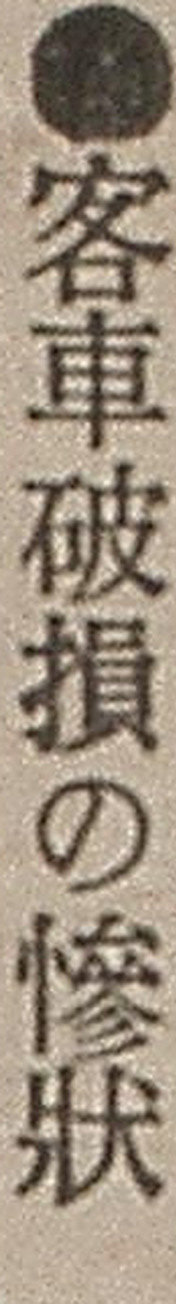●客車破損の惨状
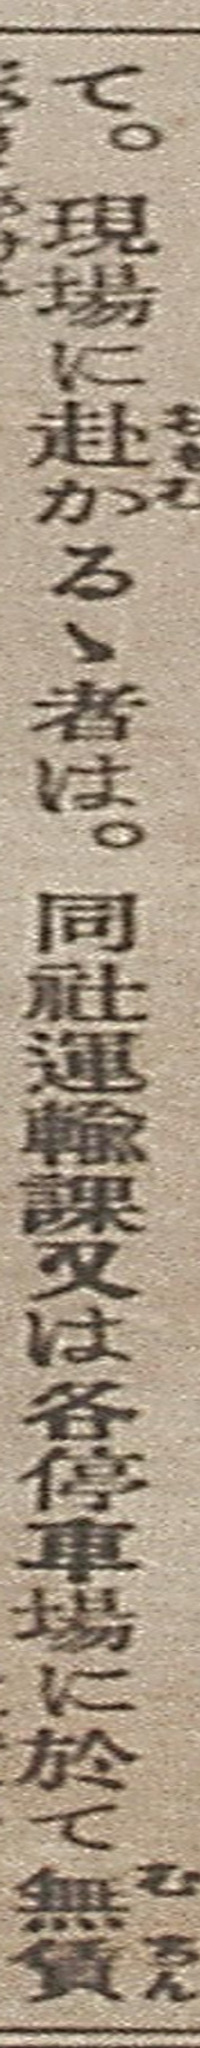て。現場に赴かるゝ者は。同社運輸課又は各停車場に於て無賃
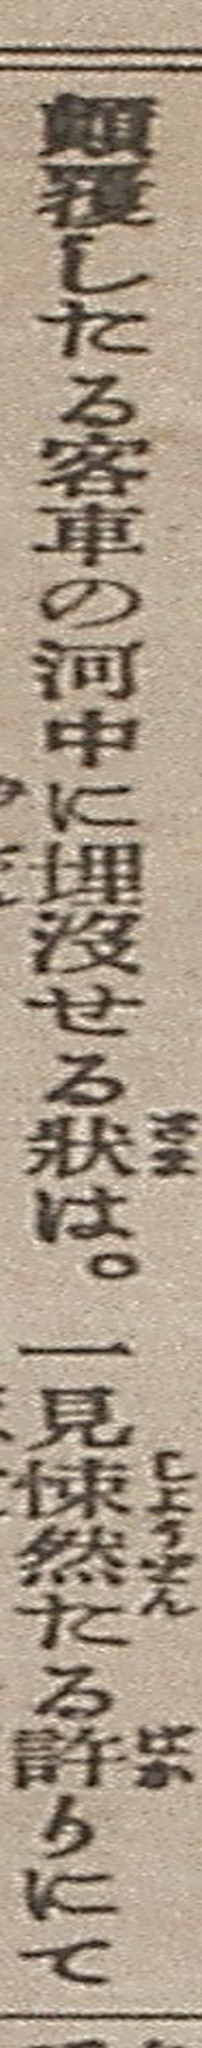顛覆したる客車の河中に埋没せる状は。一見悚然たる許りにて
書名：風俗畫報臨時増刊第百九十九號　明治三十二年十月各地災害圖會（前編之續）
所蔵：東京大学地震研究所図書室 Earthquake Research Institute Library, The University of Tokyo, JAPAN
